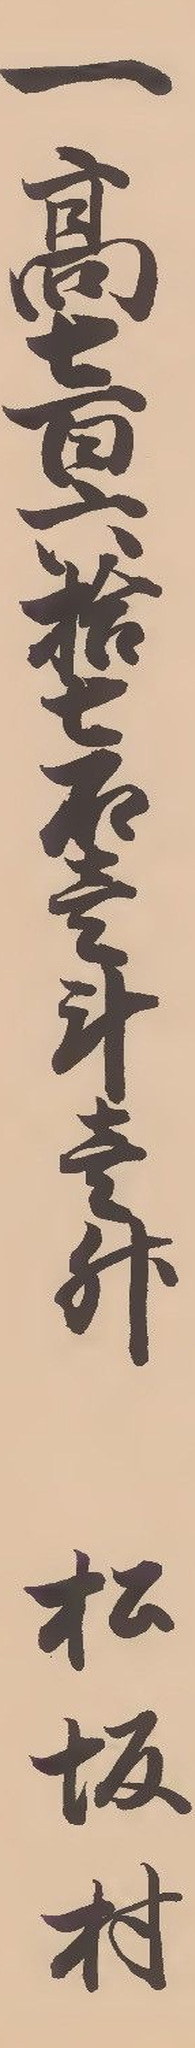一高七百六拾七石壱斗壱升松坂村

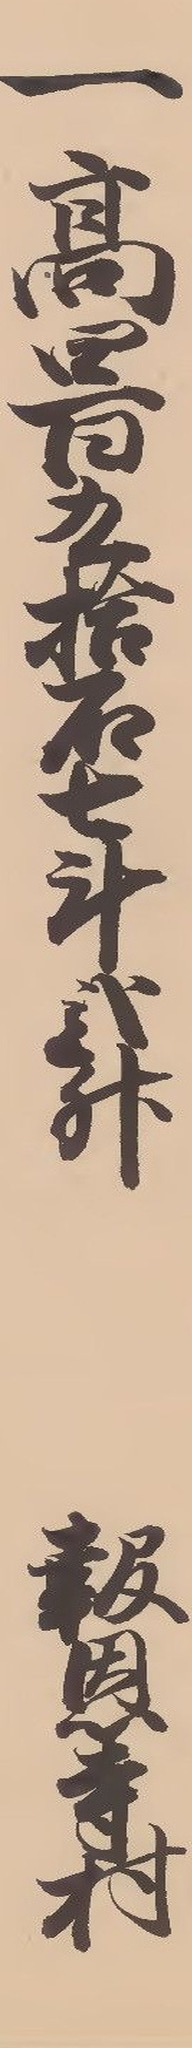一高四百九拾石七斗弐升報恩寺村
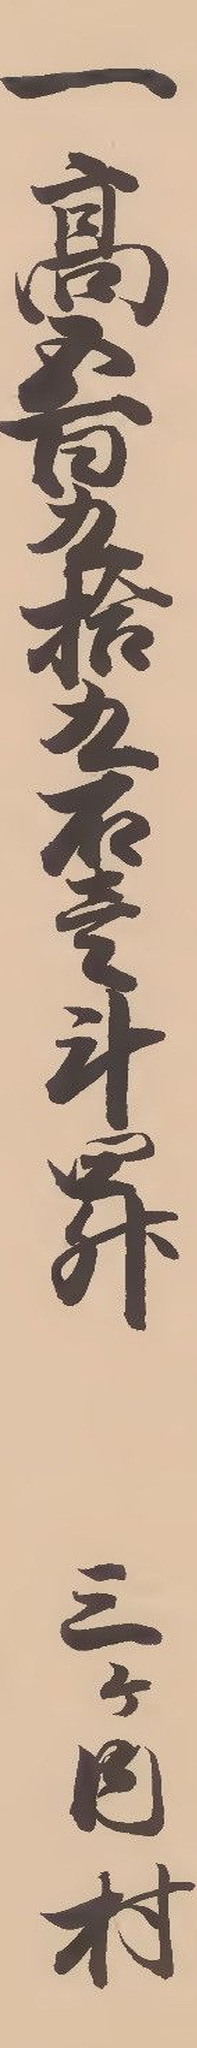一高五百九拾九石壱斗四升三ヶ内村
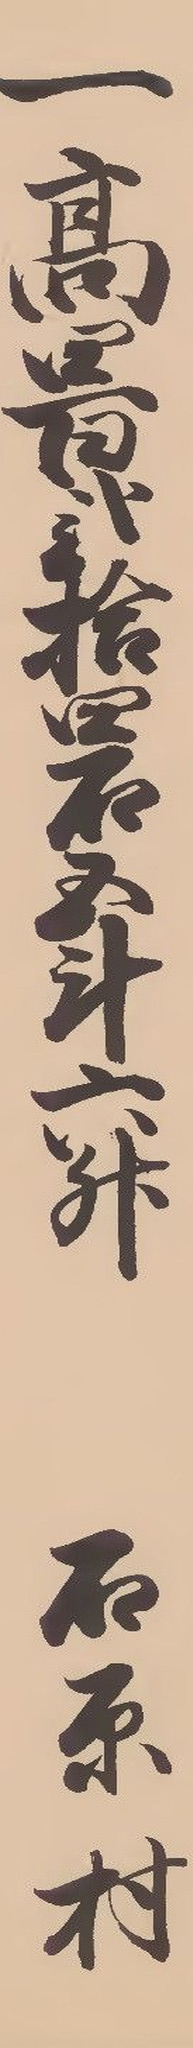一高四百弐拾四石五斗六升石原村
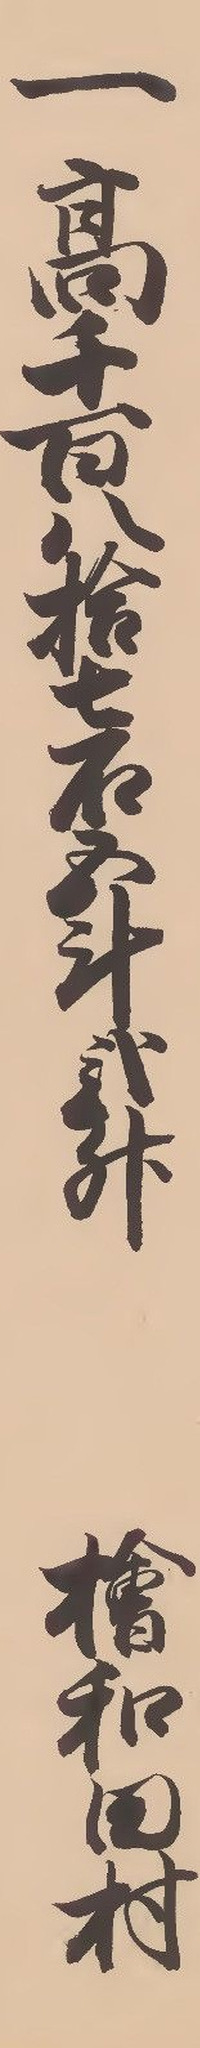一高千百八拾七石五斗弐升檜和田村
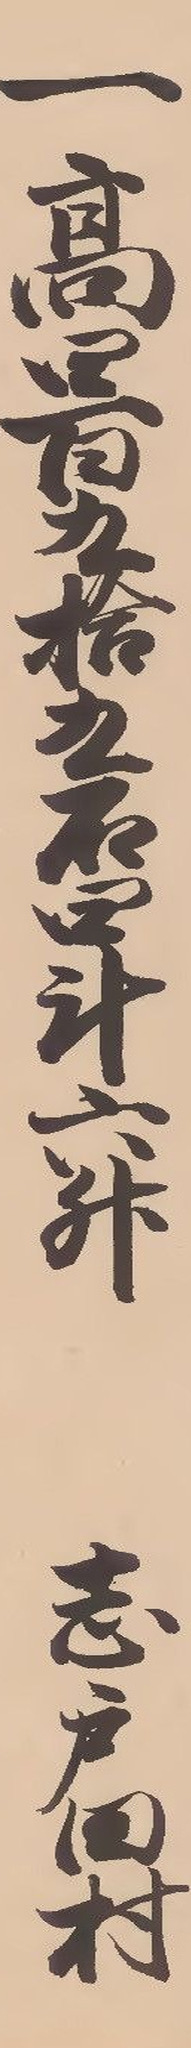一高四百九拾九石四斗六升志戸田村
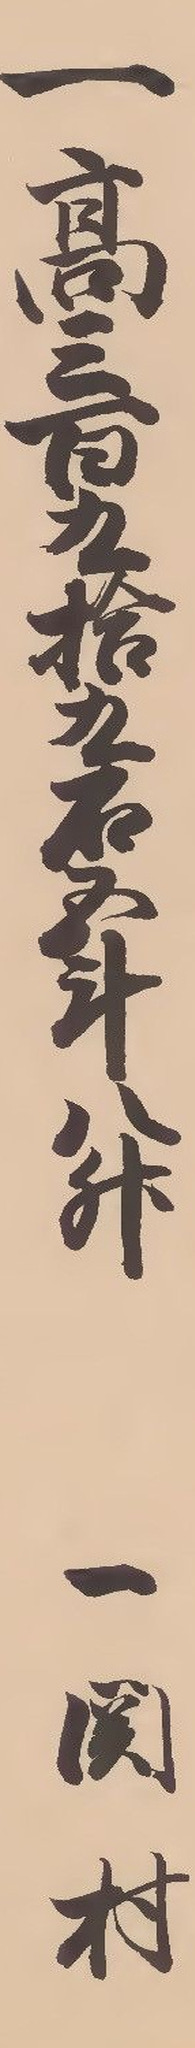一高三百九拾九石五斗八升一関村
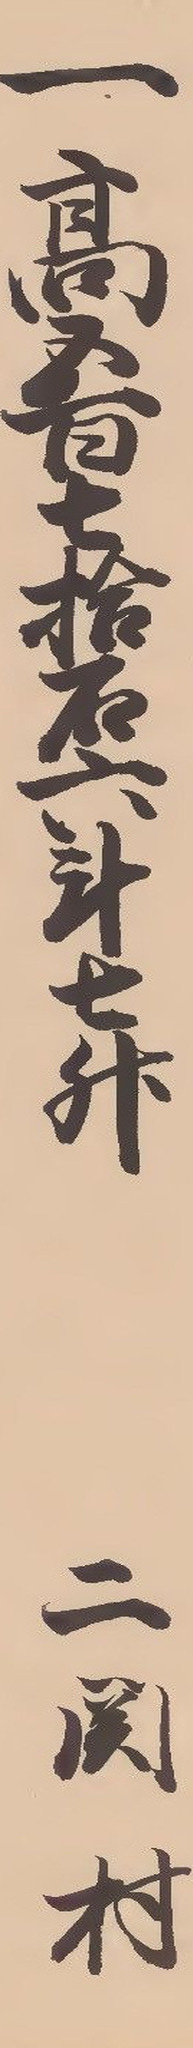一高五百七拾石六斗七升二関村
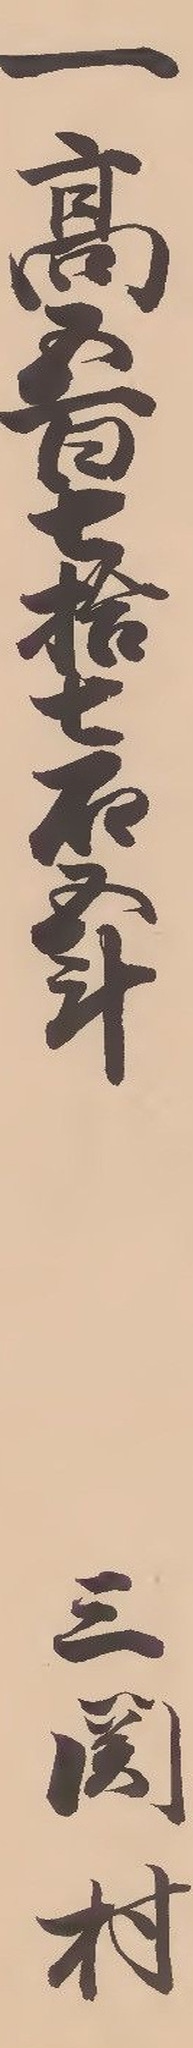一高五百七拾七石五斗三関村

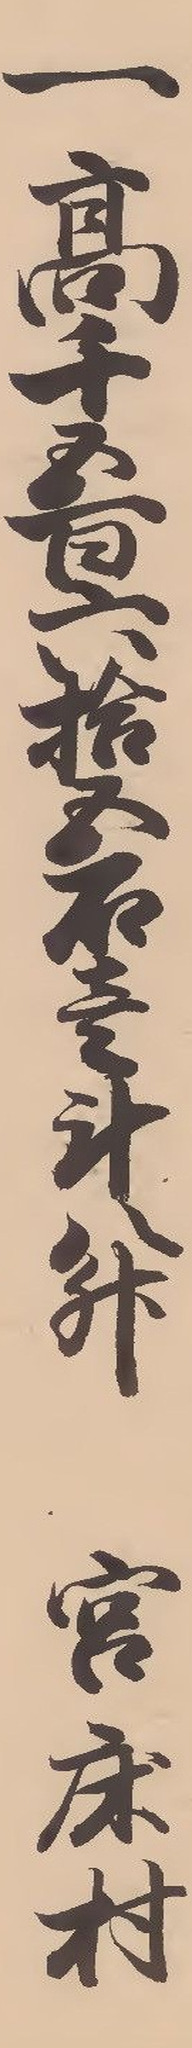一高千五百六拾五石壱斗八升宮床村
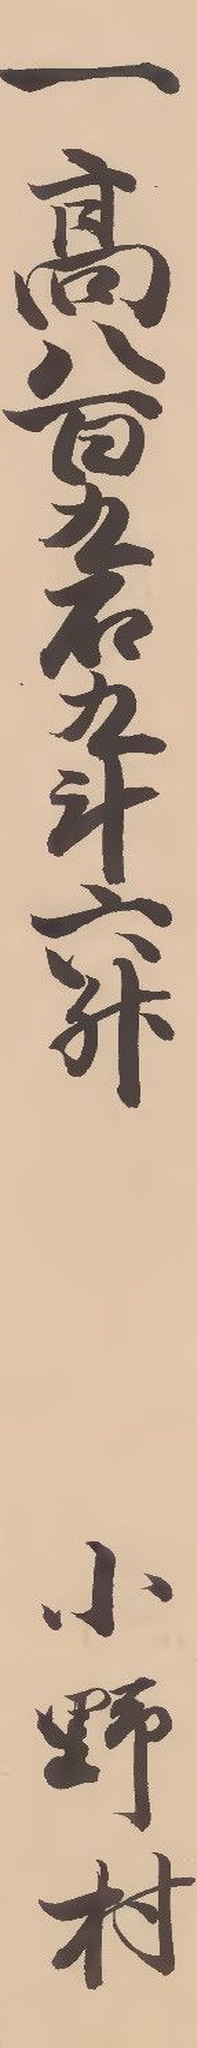一高八百九石九斗六升小野村
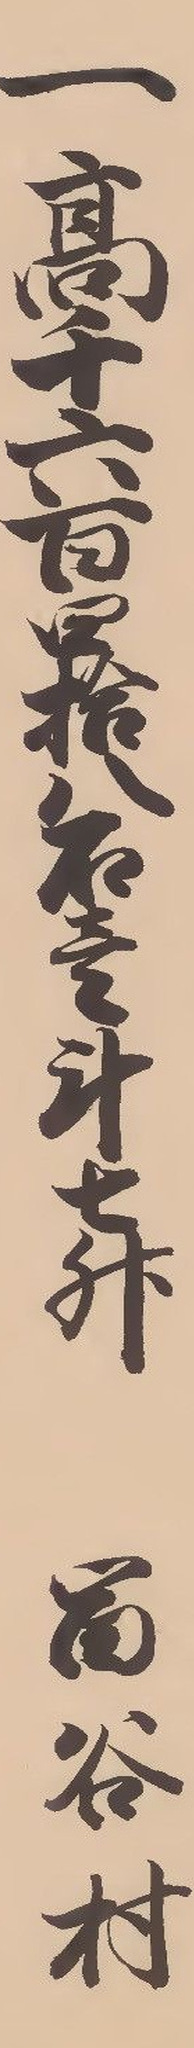一高千六百四拾八石壱斗七升富谷村
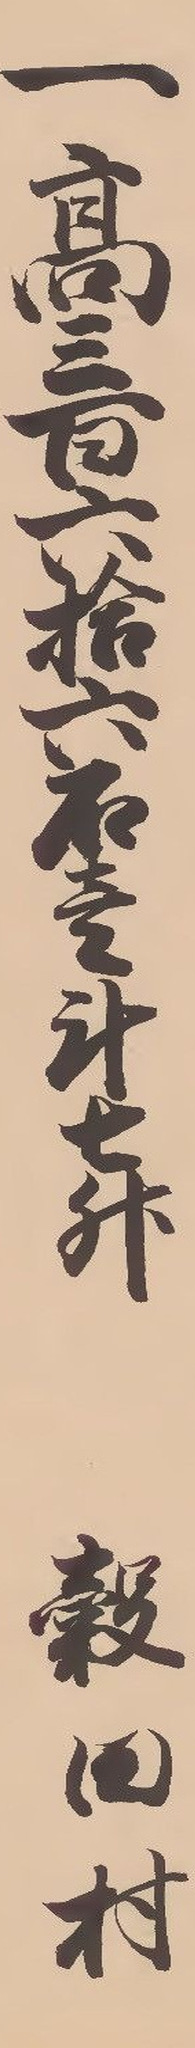一高三百六拾六石壱斗七升穀田村
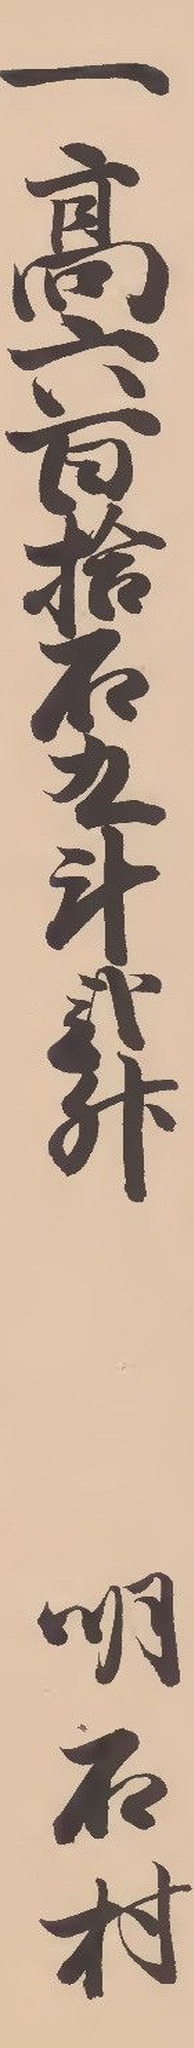一高六百拾石九斗弐升明石村
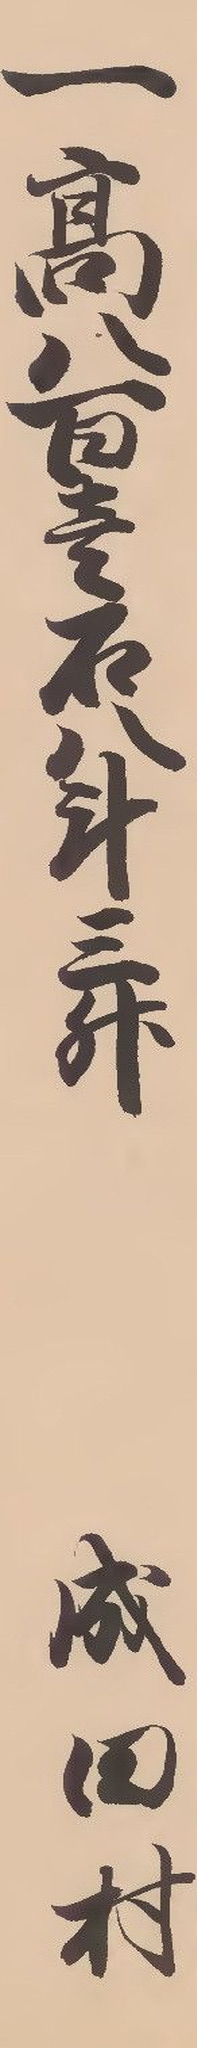一高八百壱石八斗三升成田村
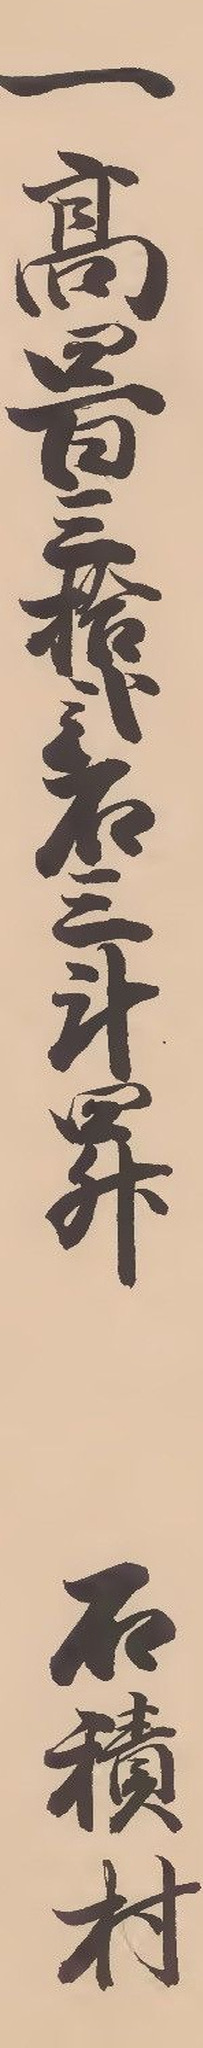一高四百三拾弐石三斗四升石積村
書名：陸奥国郷帳　５
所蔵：国立公文書館 National Archives of Japan
